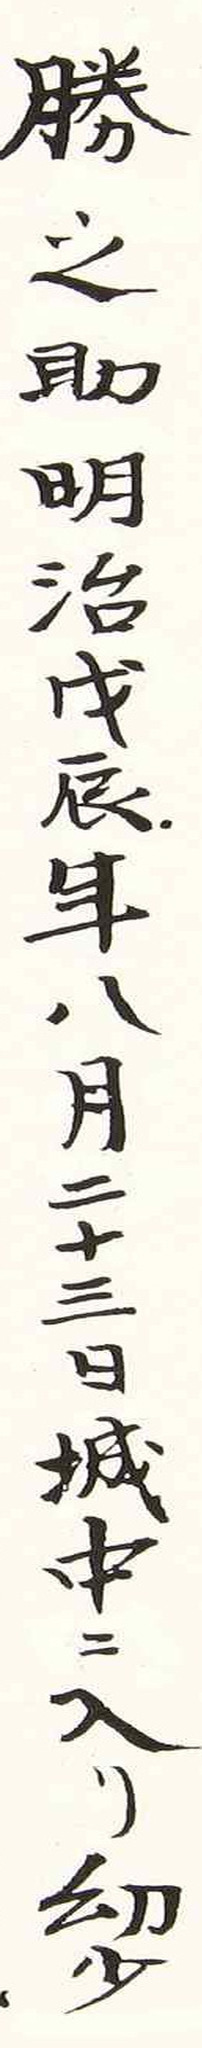勝之助明治戊辰年八月二十三日城中ニ入リ幼少
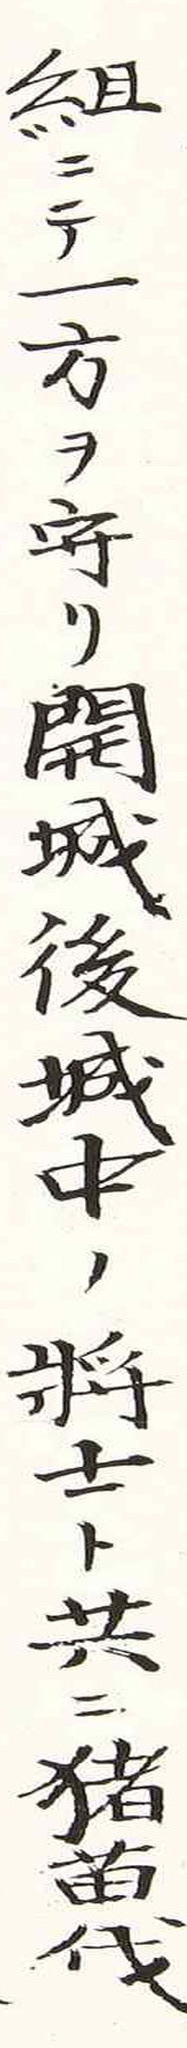組ニテ一方ヲ守リ開城後城中ノ将士ト共ニ猪苗代
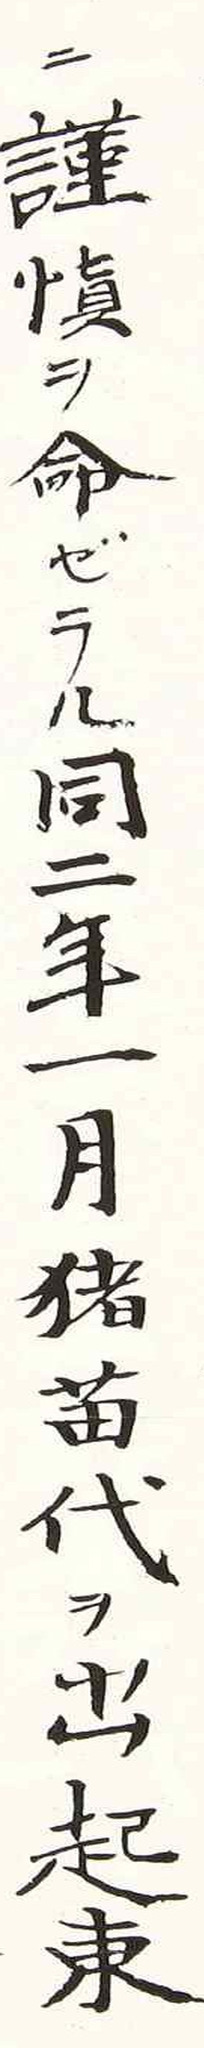ニ謹慎ヲ命ゼラル同二年一月猪苗代ヲ出起東
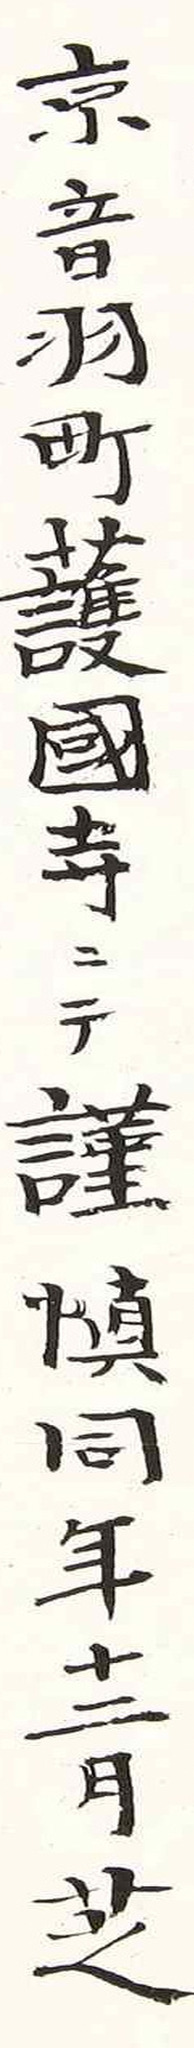京音羽町護国寺ニテ謹慎同年十二月芝
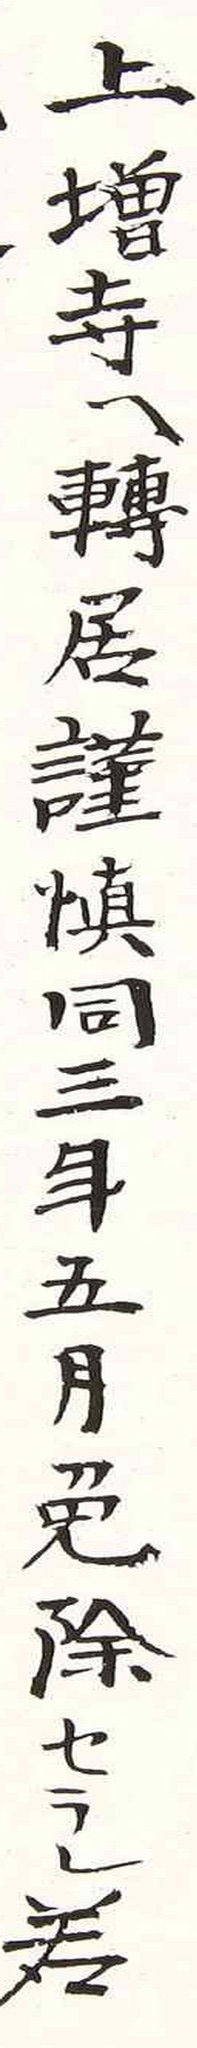上増寺へ転居謹慎同三年五月免除セラレ若
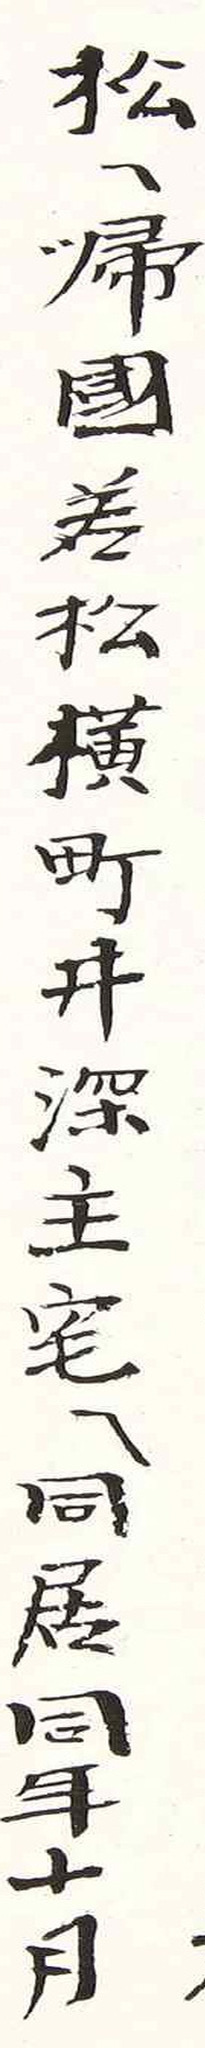松へ帰国若松横町井深主宅へ同居同十月
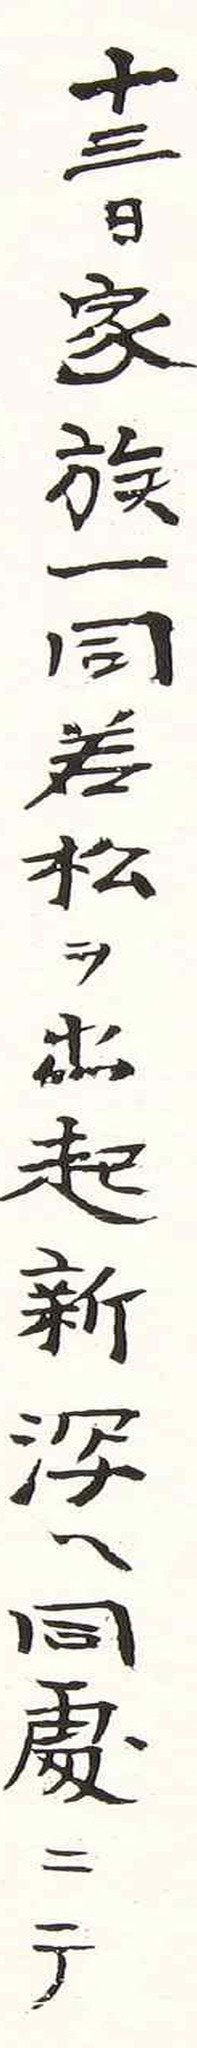十三日家族一同若松ヲ出起新潟へ同処ニテ
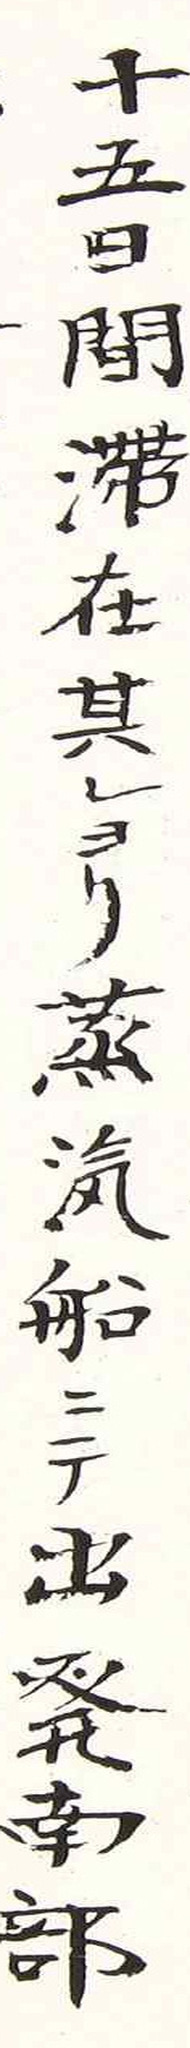十五日間滞在其レヨリ蒸気船ニテ出発南部
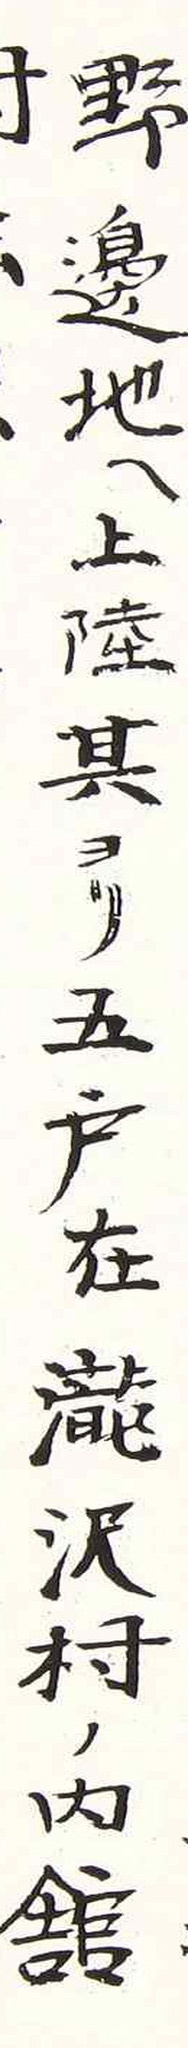野辺地へ上陸其ヨリ五戸在滝沢村ノ内舘
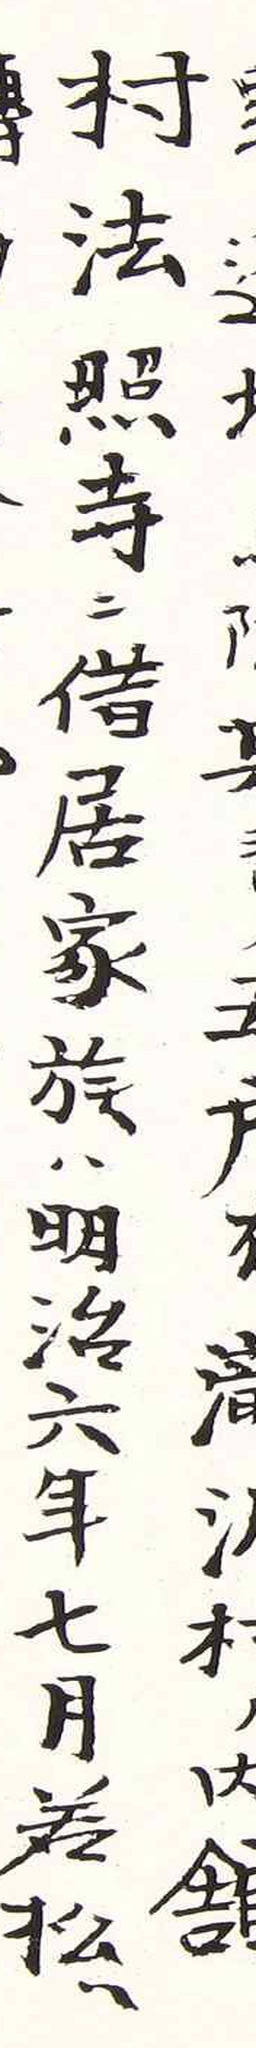村法照寺ニ借居家族ハ明治六年七月若松へ
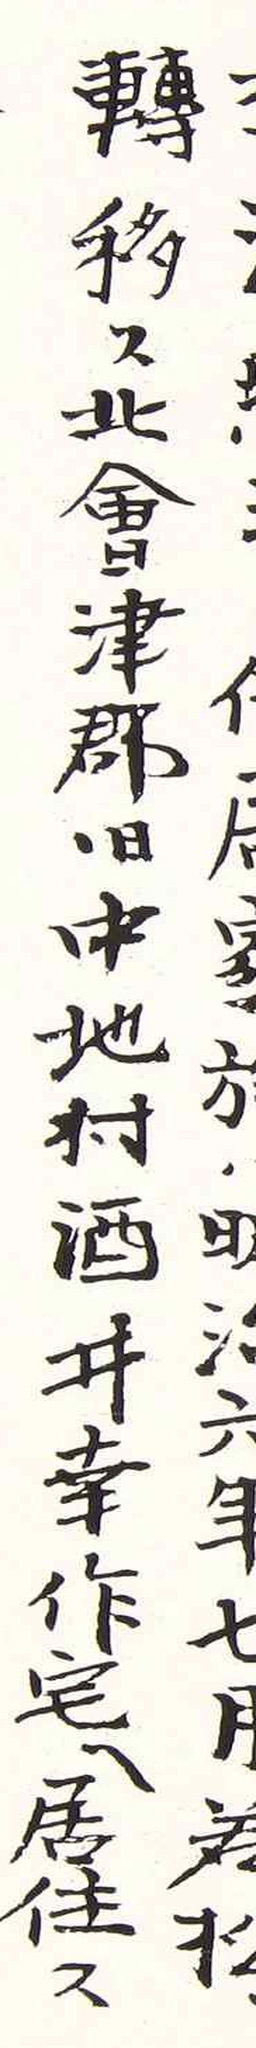転移ス北会津郡旧中地村酒井幸作宅へ居住ス
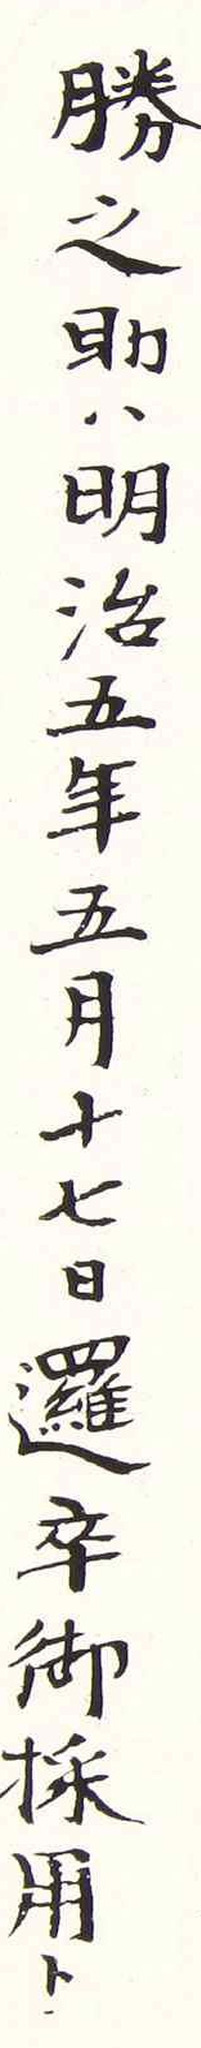勝之助ハ明治五年十七日邏卒御採用ト

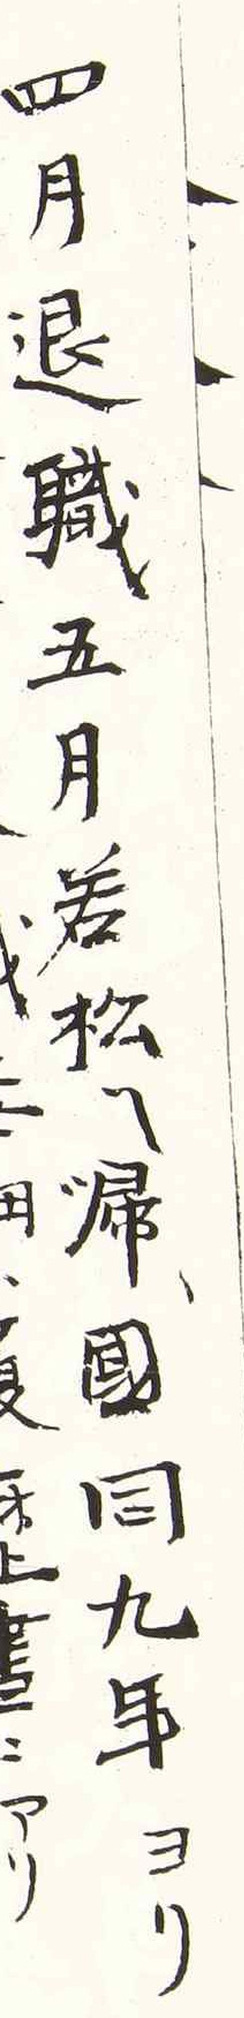四月退職五月若松へ帰国同九年ヨリ
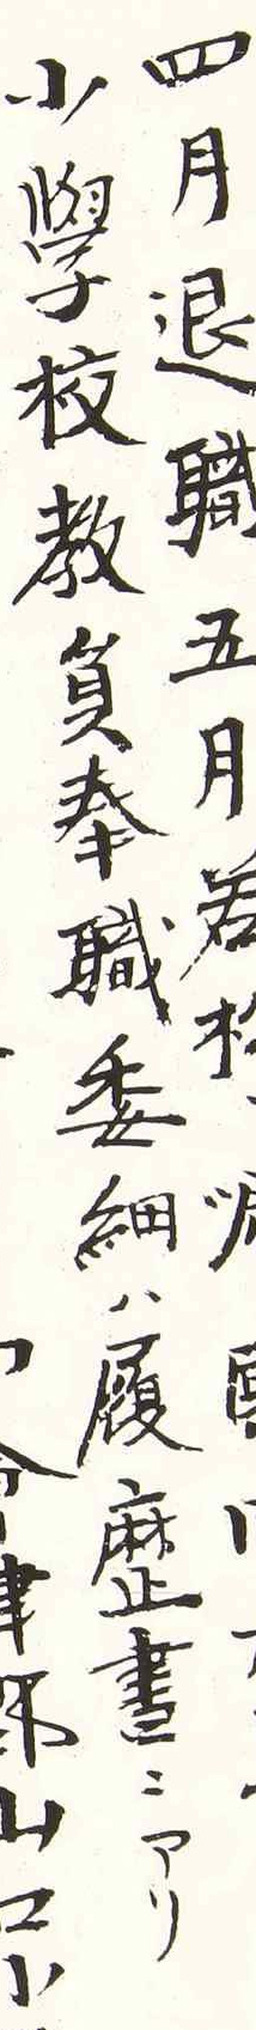小学校教員奉職委細ハ履歴書ニアリ
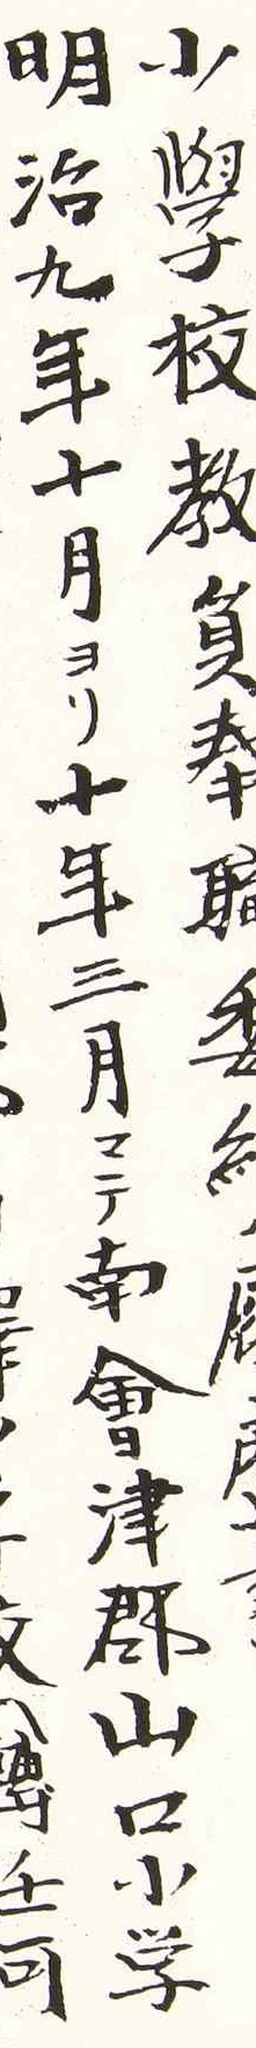明治九年十月ヨリ十年三月マテ南会津郡山口小学
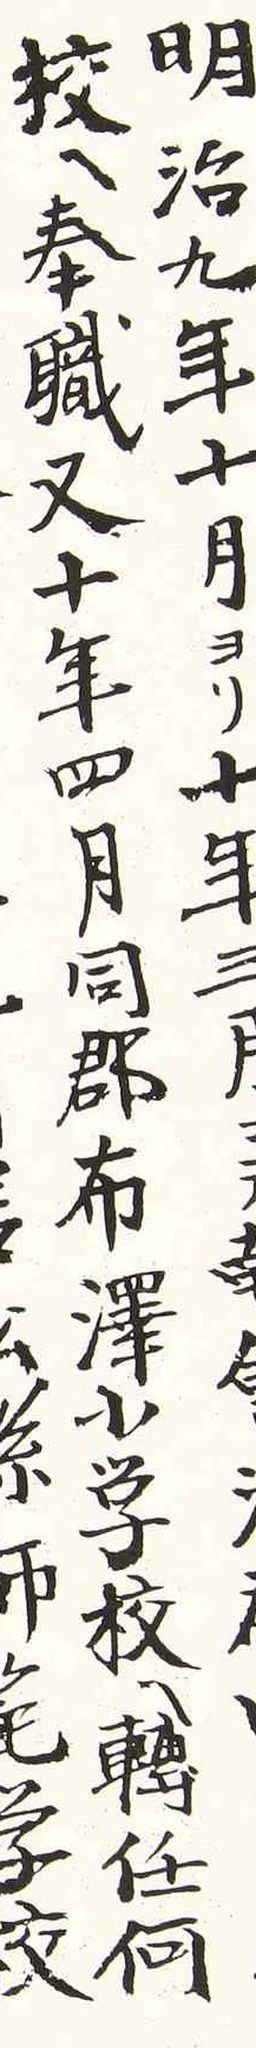校へ奉職又十年四月同郡布沢小学校へ転任何
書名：諸士系譜　巻之357　す之部7
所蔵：会津若松市立会津図書館
